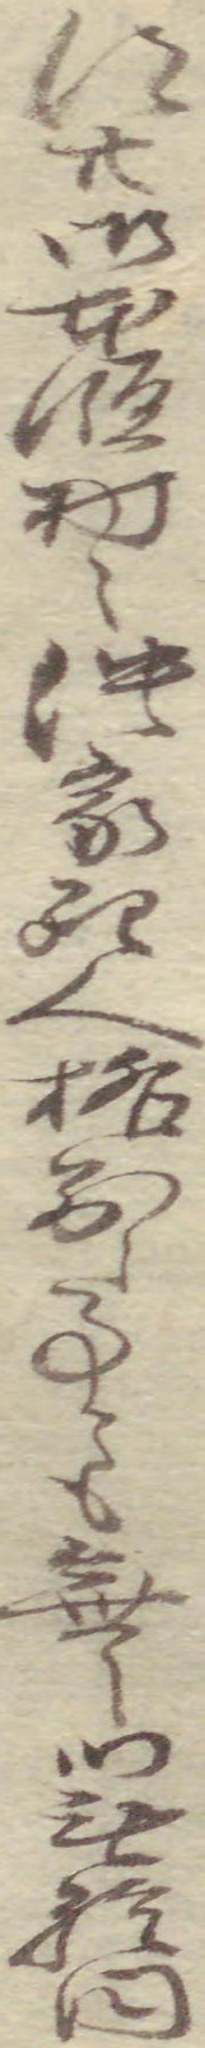得共御本領村々潰家死人格別之事ニも無之御無難同
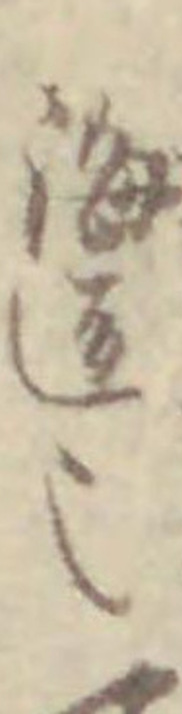海道也
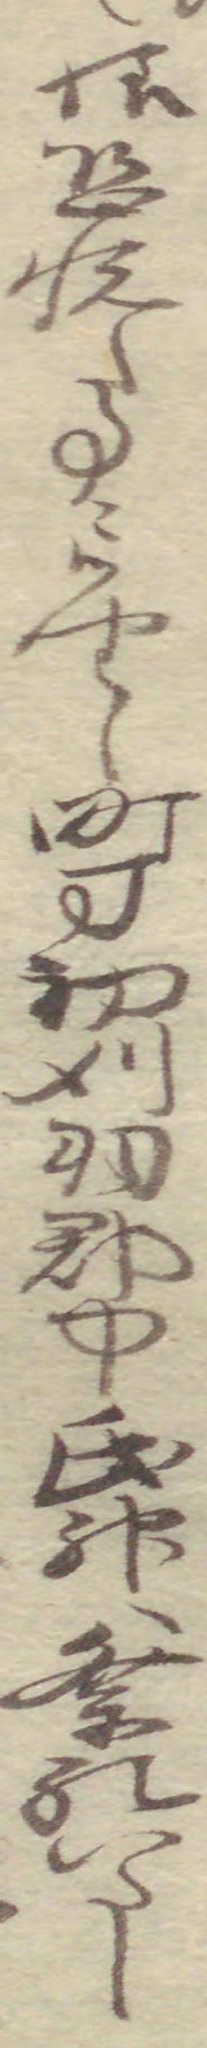様恐悦之事ニ御座候町方初刈羽郡中氏神へ祭礼いたし

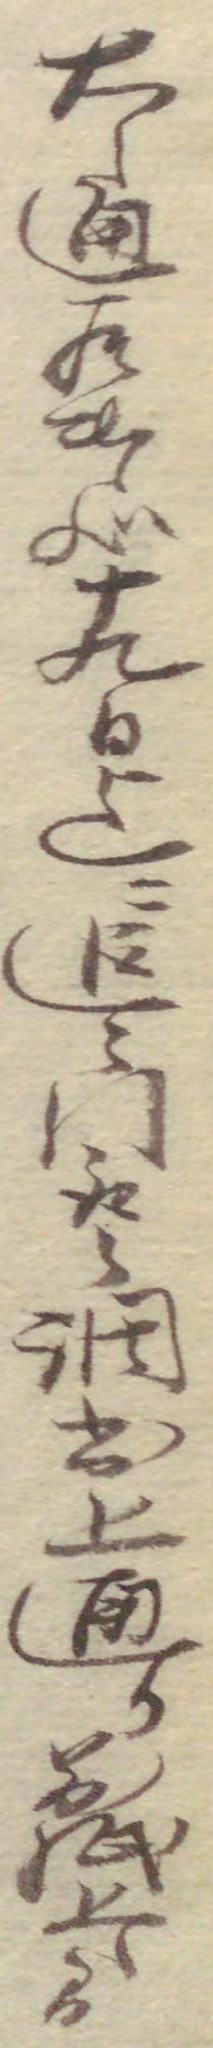右之通罷出候処十九日迄ニ追〻引取候調書上通り別紙上候間
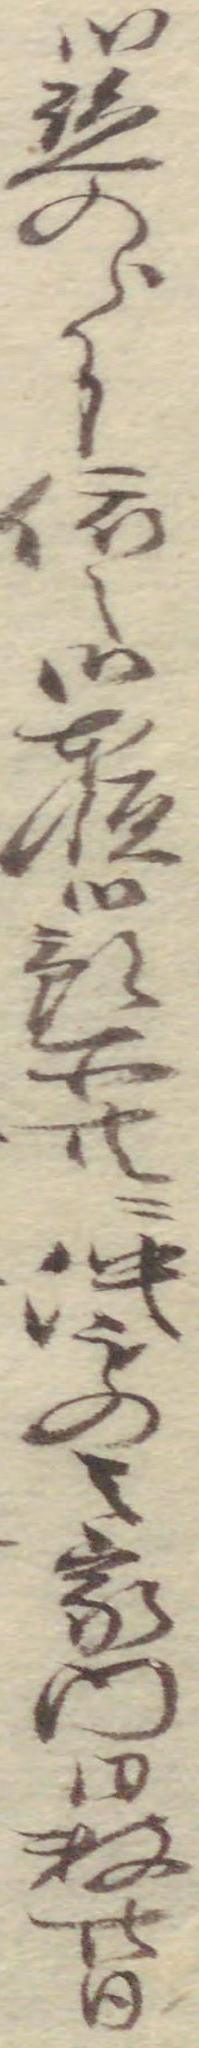御覧可被下候依之御本領御預所共ニ潰もの之家内日数廿日
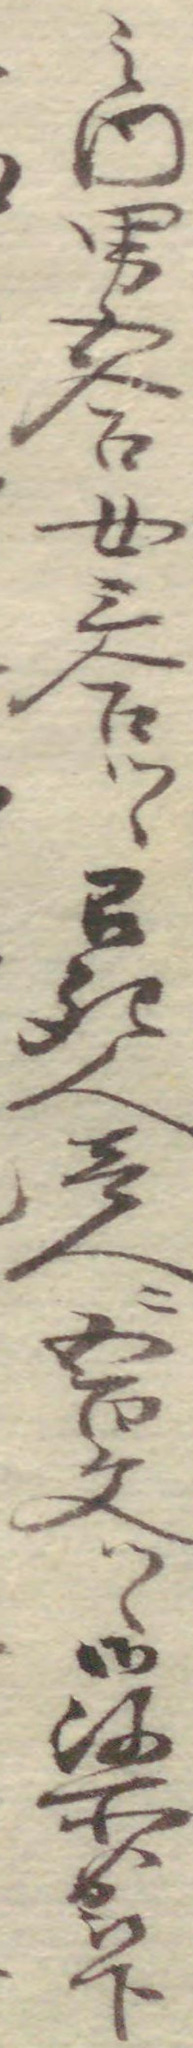之内男五合女三合ツヽ即死人壱人ニ五百文ツヽ御役所ゟ被下
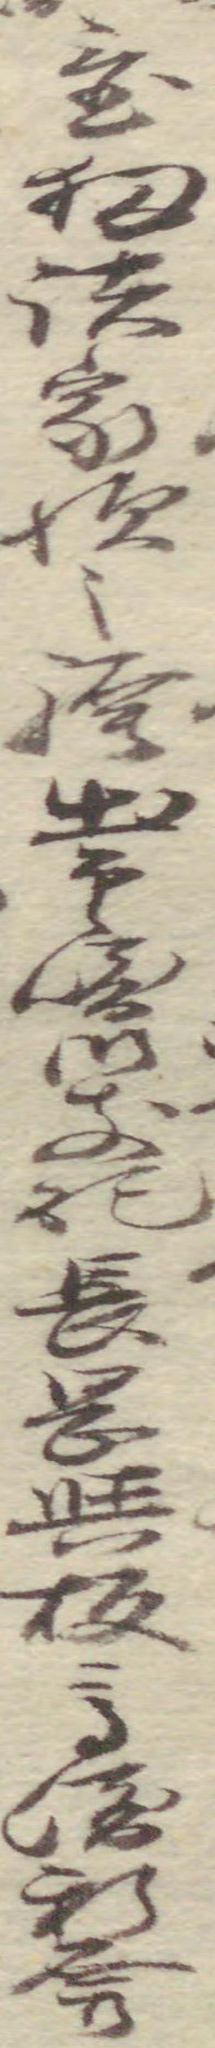置扨諸家様之騒出雲崎御支配長岡与板高崎新発
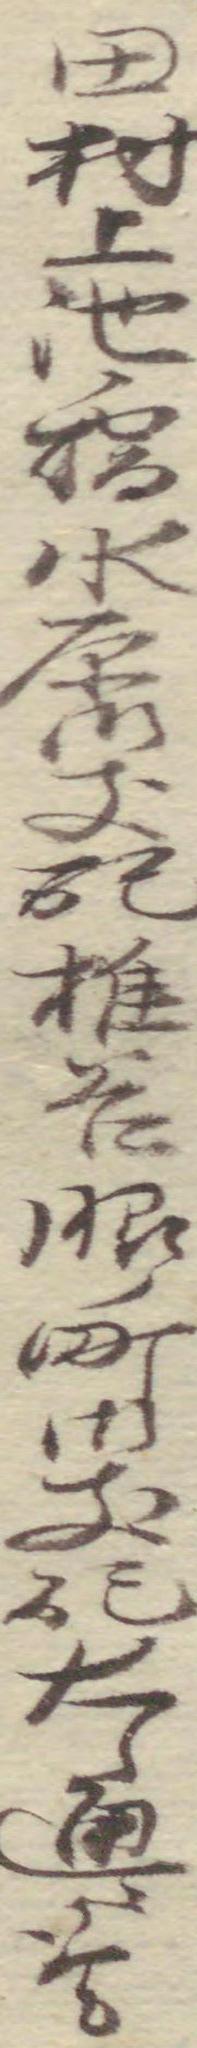田村上池ノ端水原御支配椎谷脇ノ町御支配右之通ニ御座候
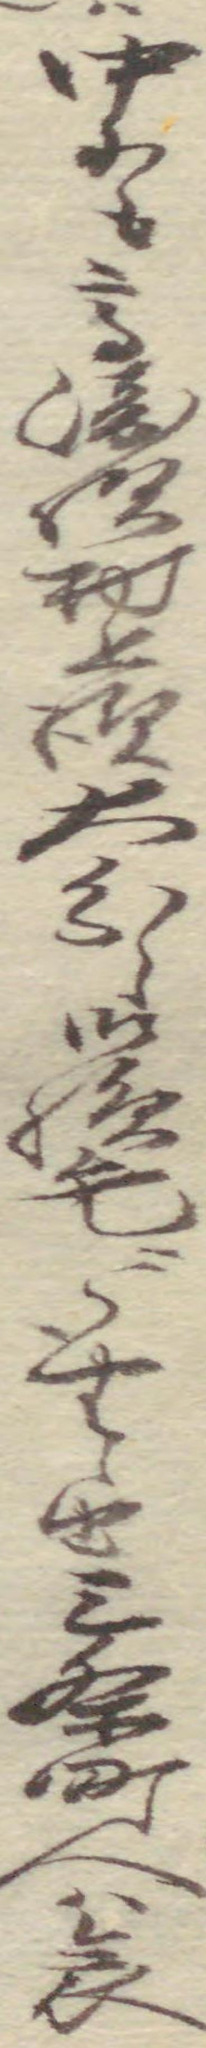中にも高崎様村上様大分之御損毛ニ御座候由三条町人ハ哀
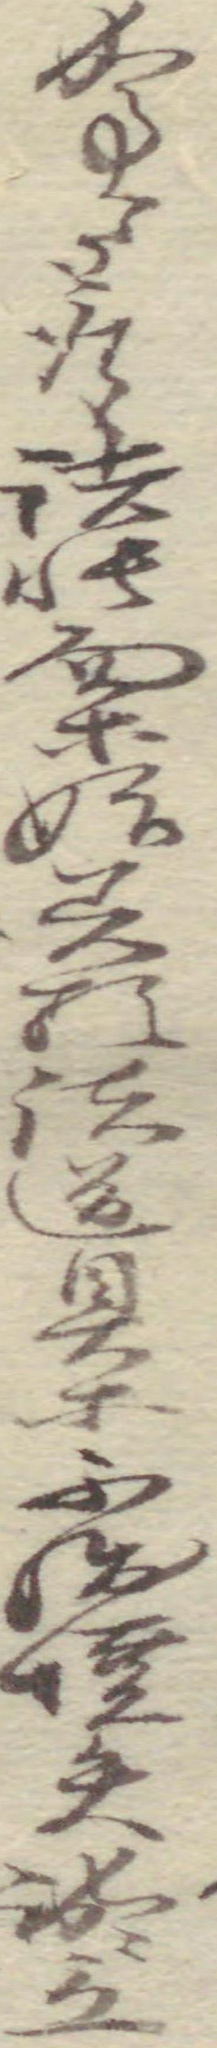成事ニ御座候諸帳面等始着類諸道具等不残焼失誠ニ立
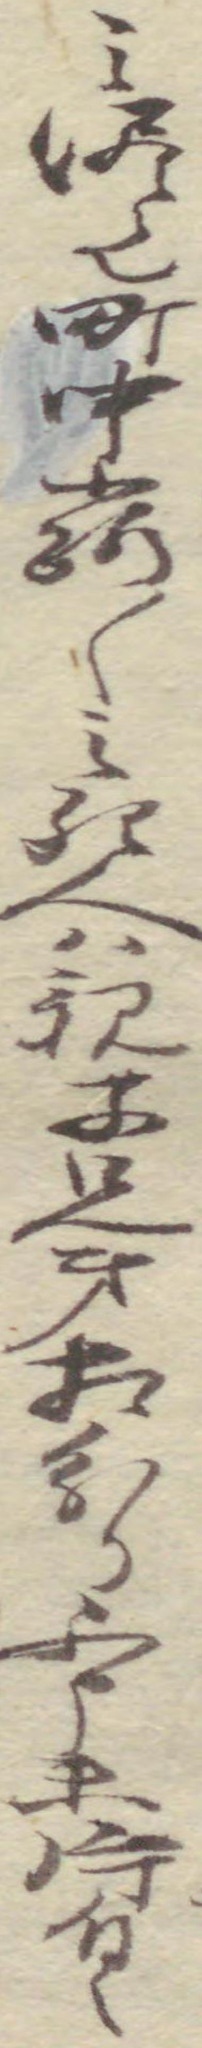之儘ニて町中小路〳〵之死人ハ親子兄弟相分り不申未片付之
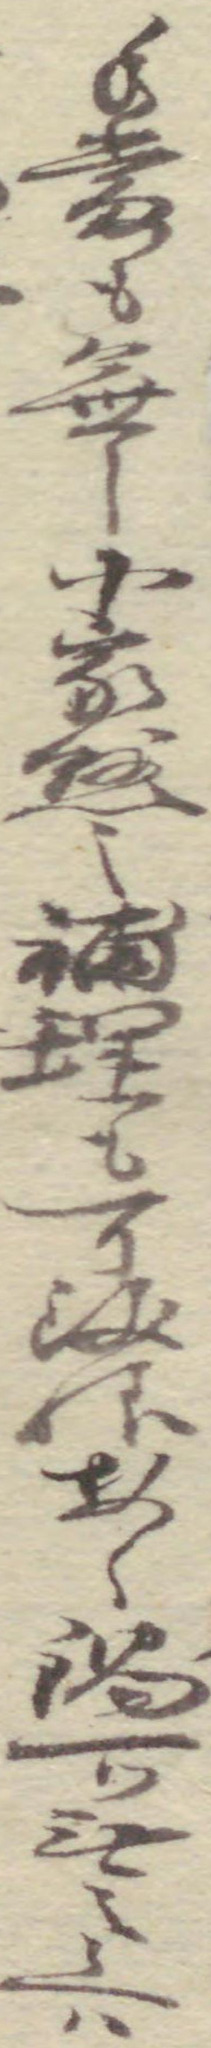手当も無之小家懸之補理も可致様なく鍋一ツ無之候へハ
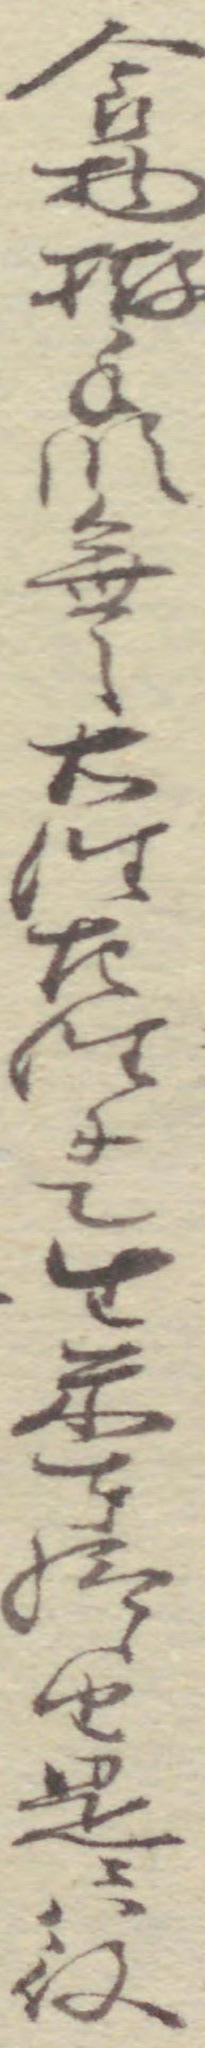食物拵手段無之右往左往にて生米を給候由是ニハ役
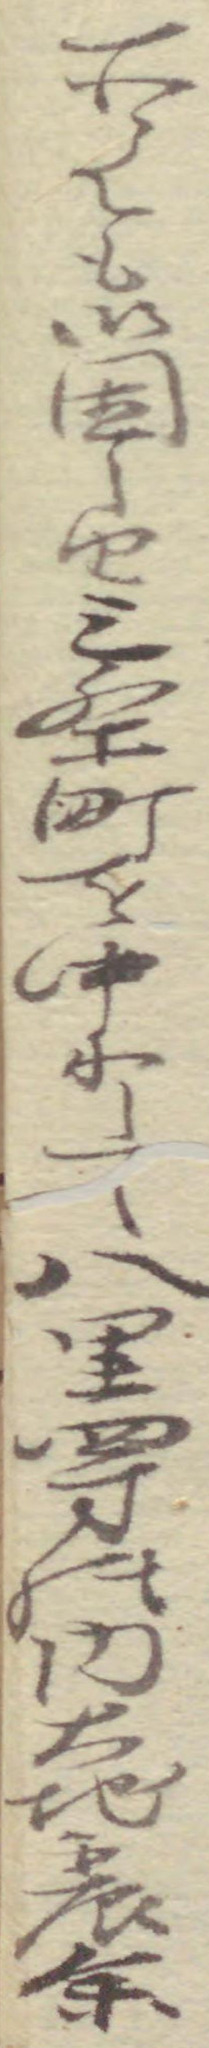所ニても御困之由三条町を中にして八里四方の内大地震余
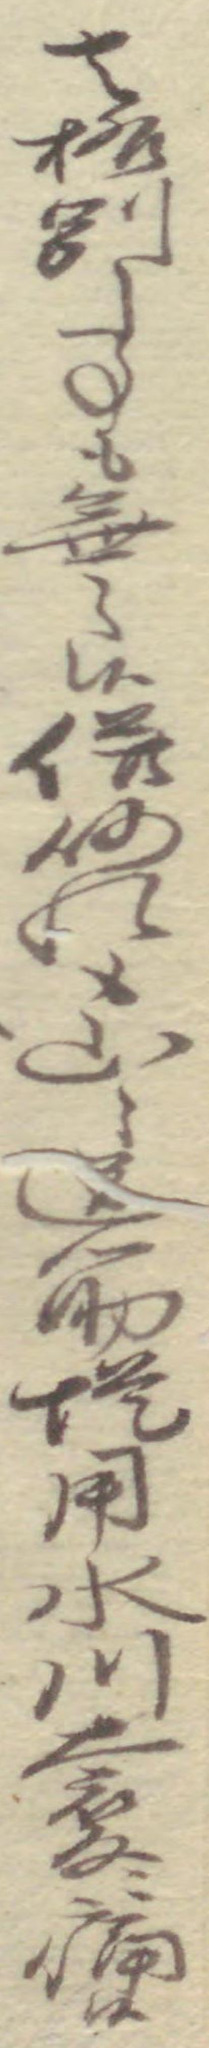は格別之事も無之候併何れも山之辺筋堤用水川大変ニ痛候
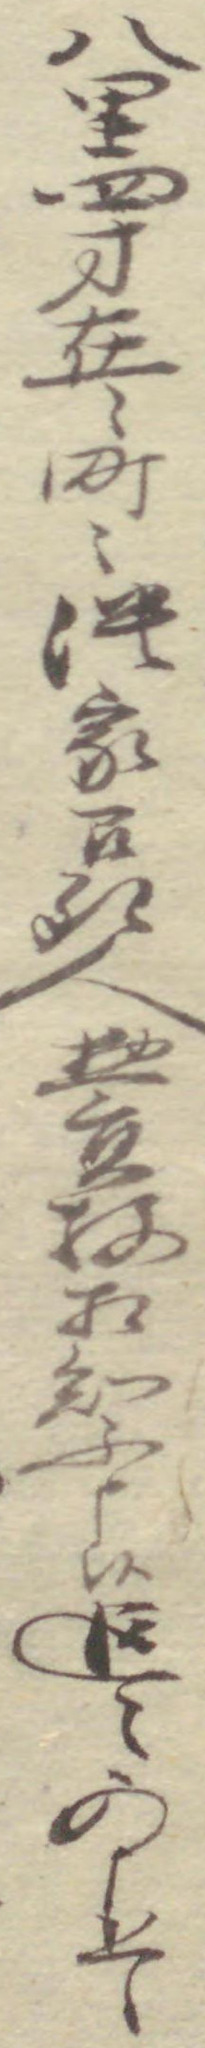八里四方在〻町〻潰家即死人惣員数相知不申候追〻可申上候
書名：鶯宿雑記. 巻199-200
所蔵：国立国会図書館 National Diet Library, JAPAN
